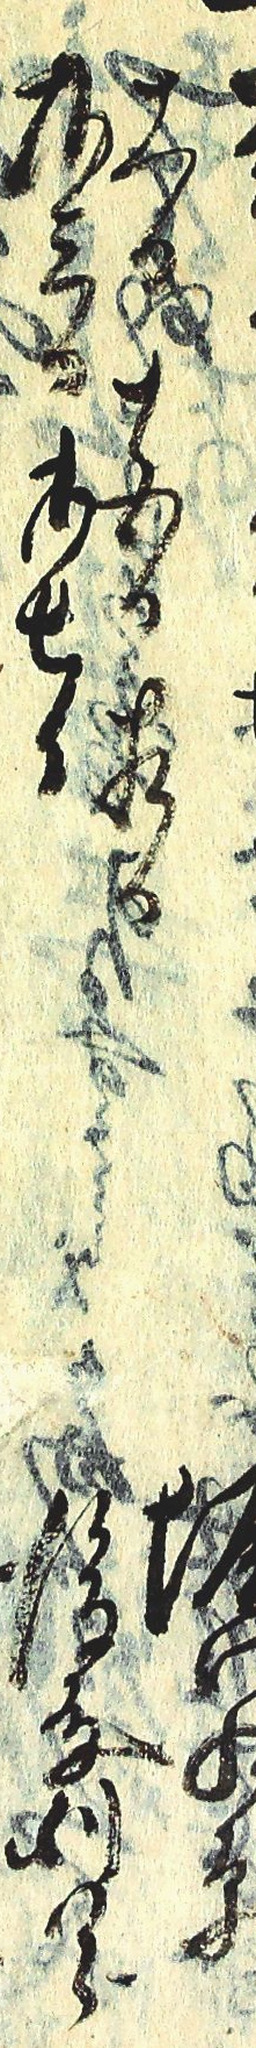廿三日廿七日伊沢与三郎
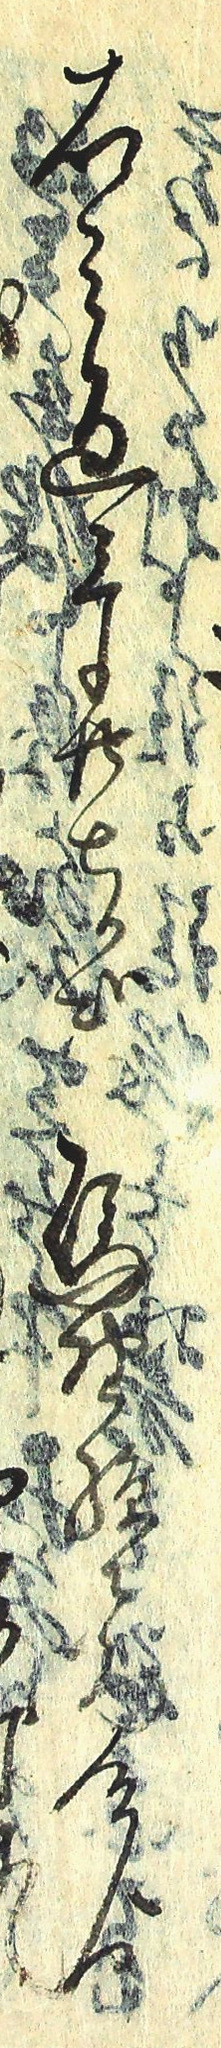右之通三月廿七日出鷹野孫右衛門殿ゟ
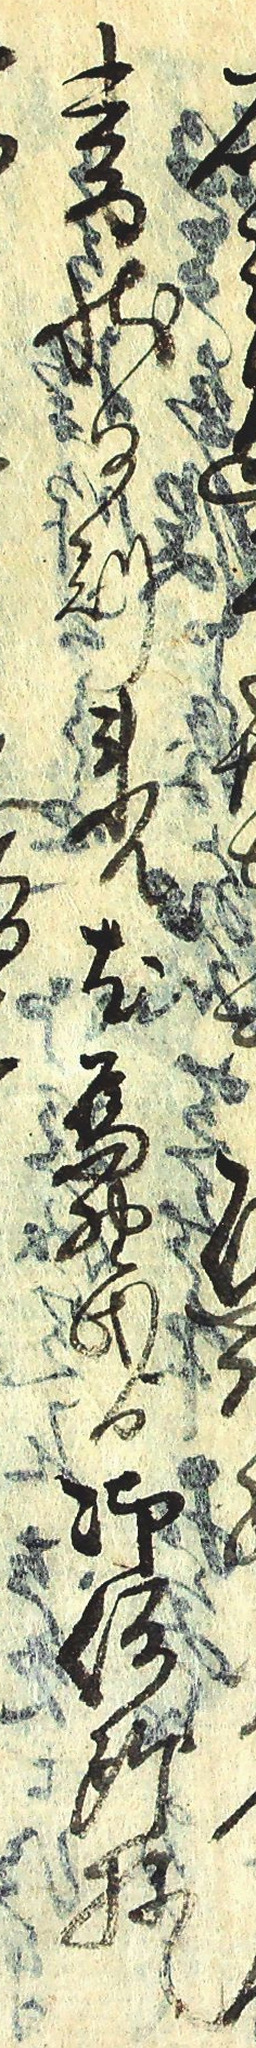書状日割来る尤鷹野氏ゟ御役所様へ
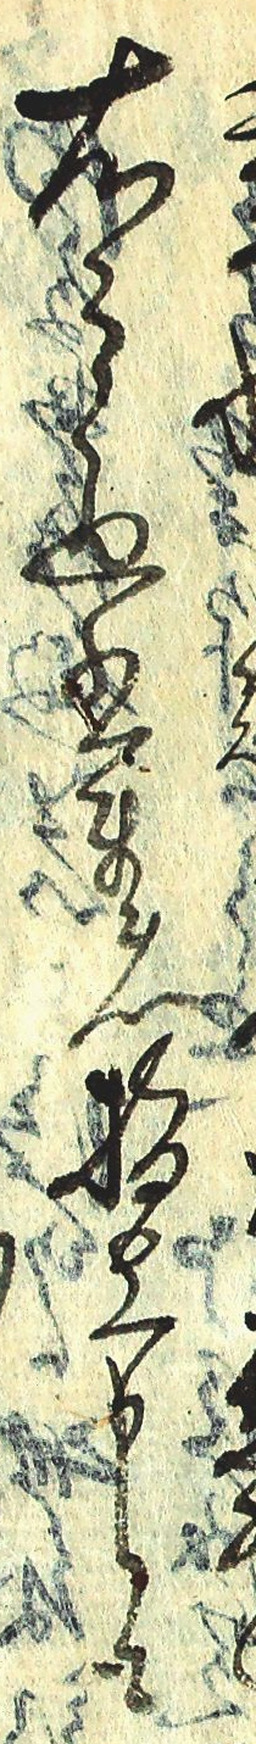右之通書付を以指上申候以上

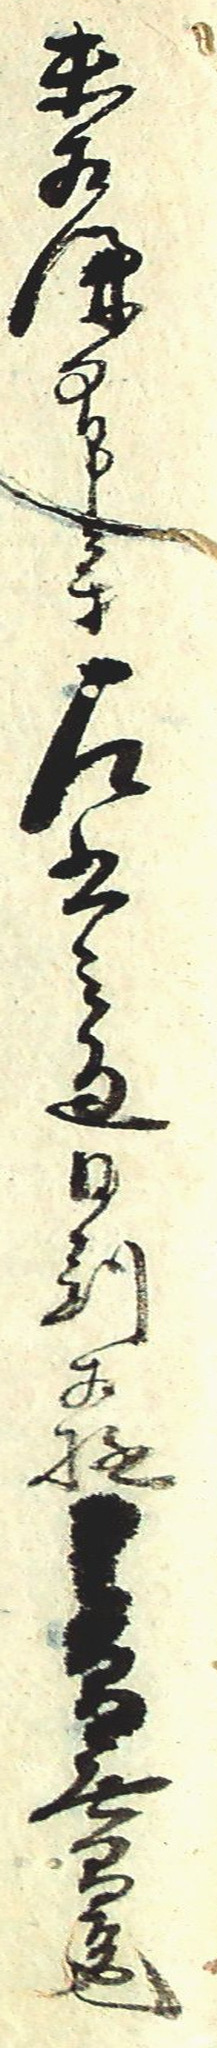未相済不申に付左書之通日割相極申候間無間違
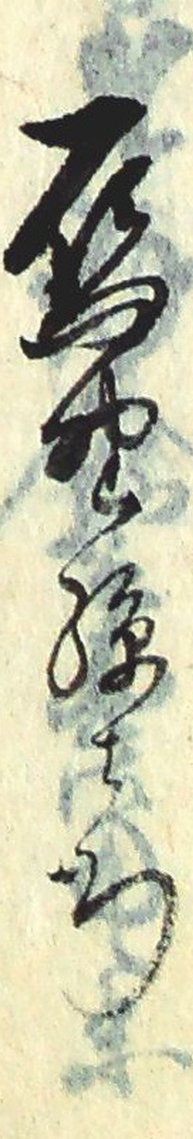鷹野孫右衛門
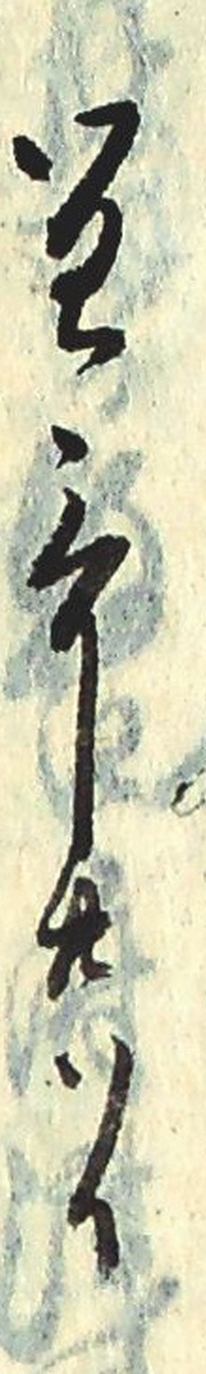閏三月廿八日
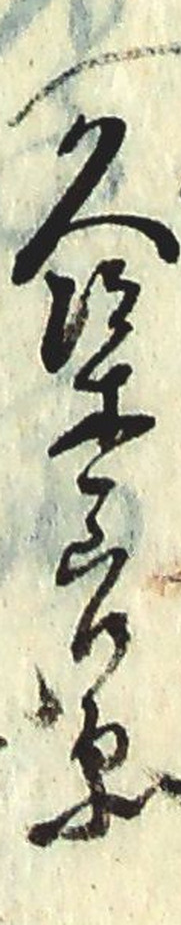久須米善兵衛
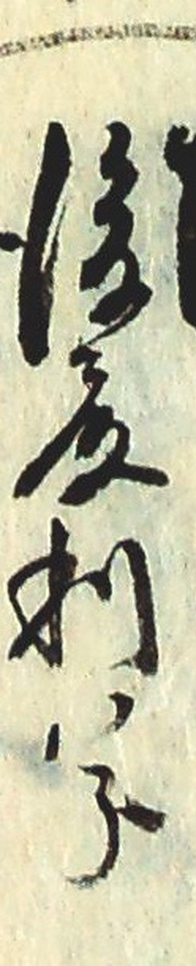後藤利八郎
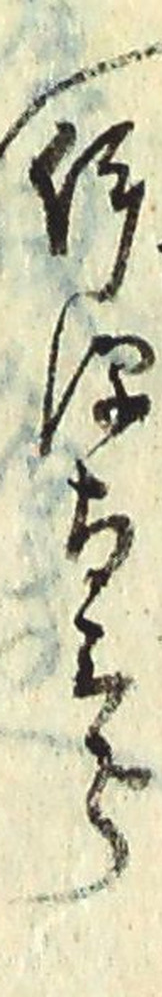伊沢与三郎
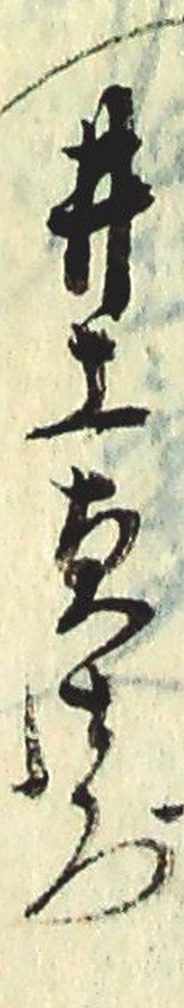井上貞右衛門
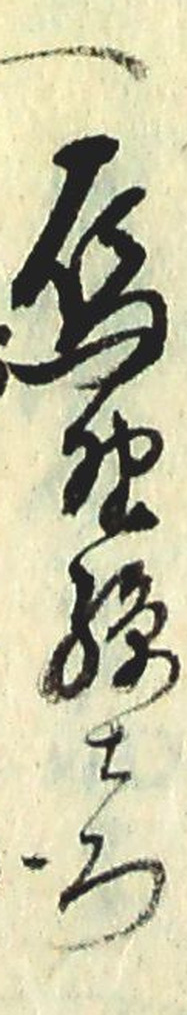鷹野孫右衛門
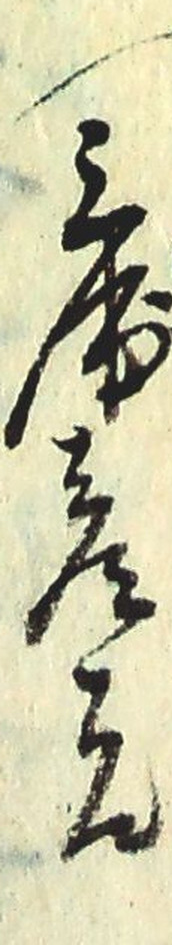三浦彦吉

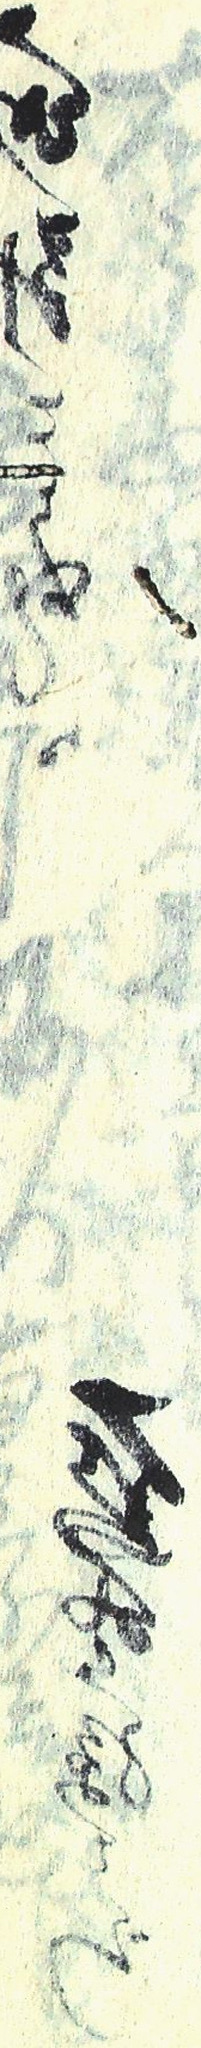四月廿六日
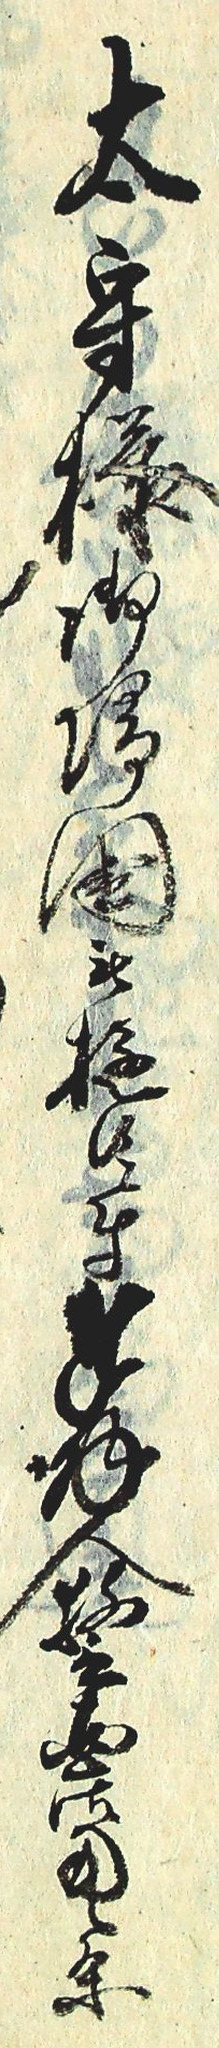太守様御帰国被遊候に付奉拝人警固御用候条
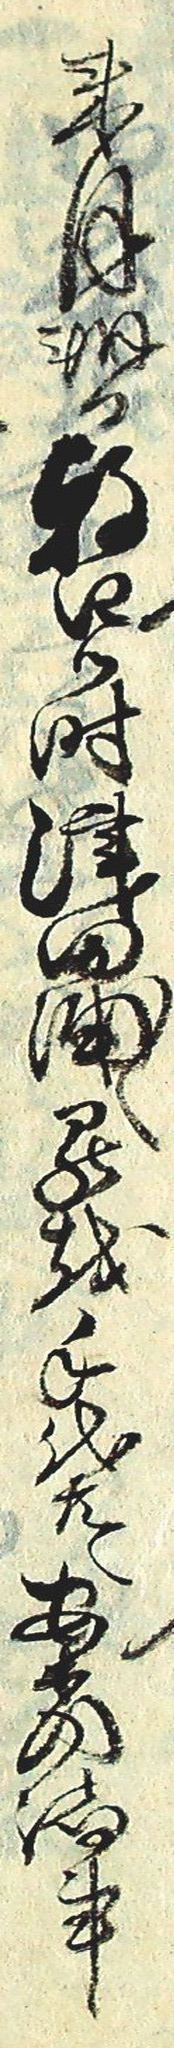来月朔日朝四つ時津田浦へ罷越手代共へ案内諸事
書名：諸御願書控(弐番）
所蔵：鳴門教育大学 Naruto University of Education
